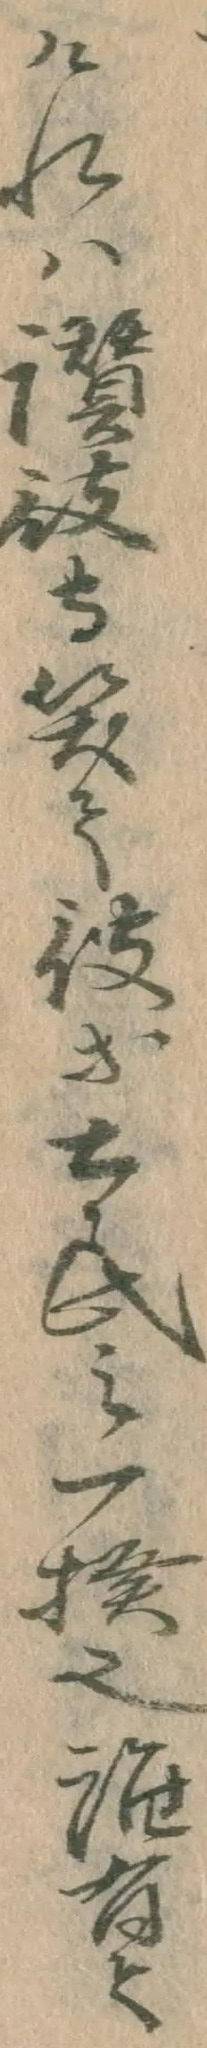けれは讃岐守笑て彼等土民之一揆也誰有て
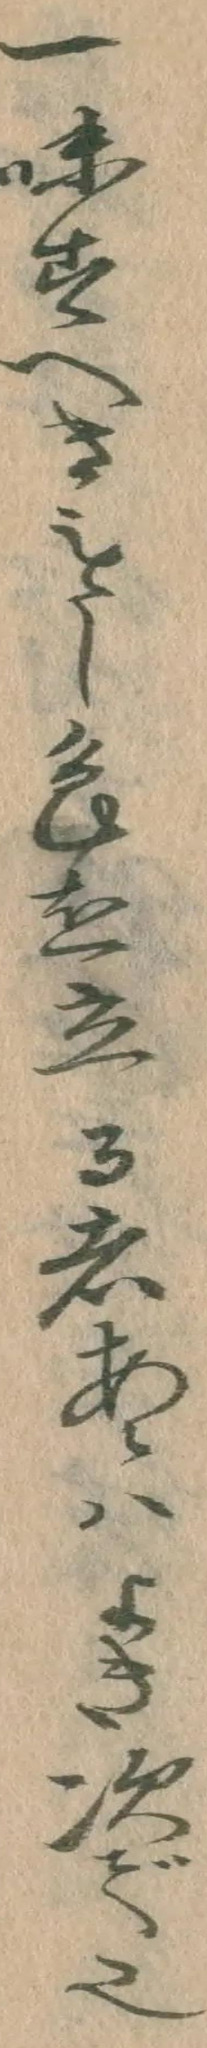一味春へきとし色を立る者あらはよき次で也
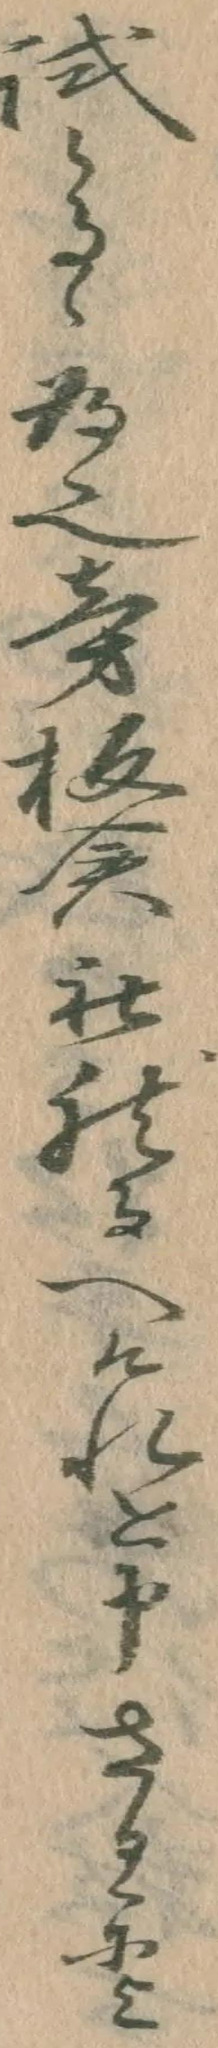試らるゝ為也旁板倉被然るへけれと申さるゝ尓与
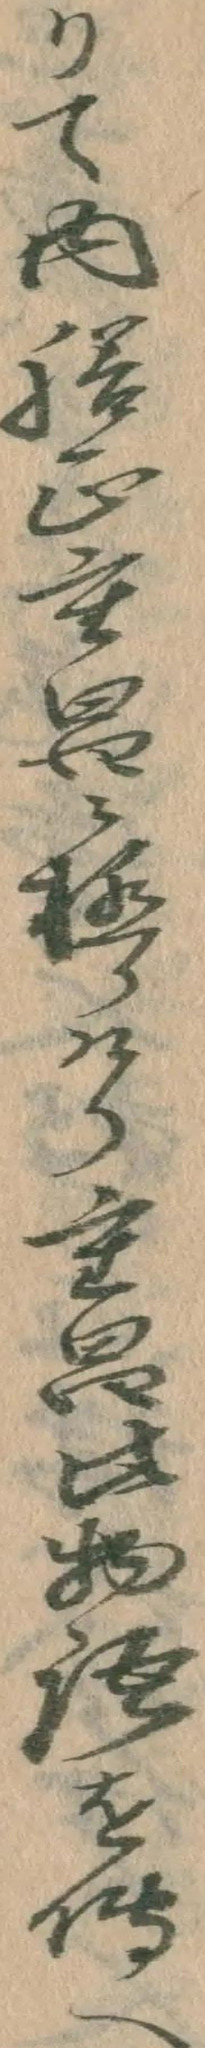りて内膳正重昌に極りけり重昌此物語を伝へ
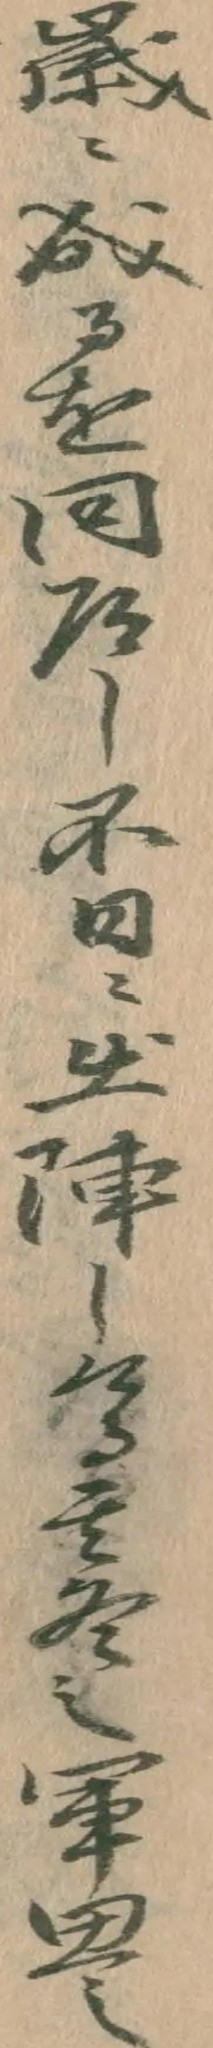歳に成るを同道し不日に出陣しける其冬之軍思之
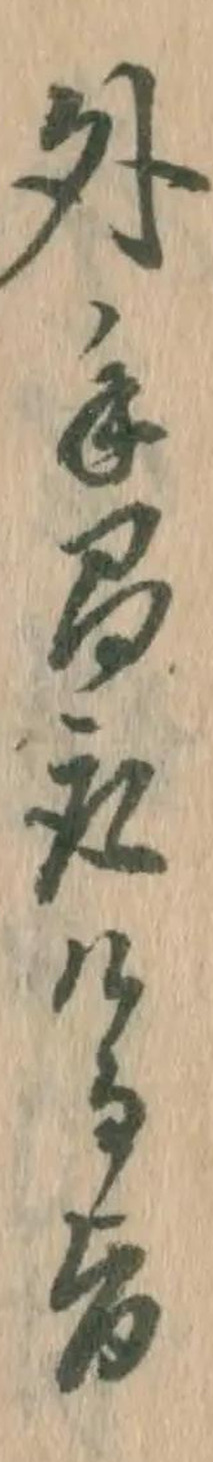外手間取ける旨
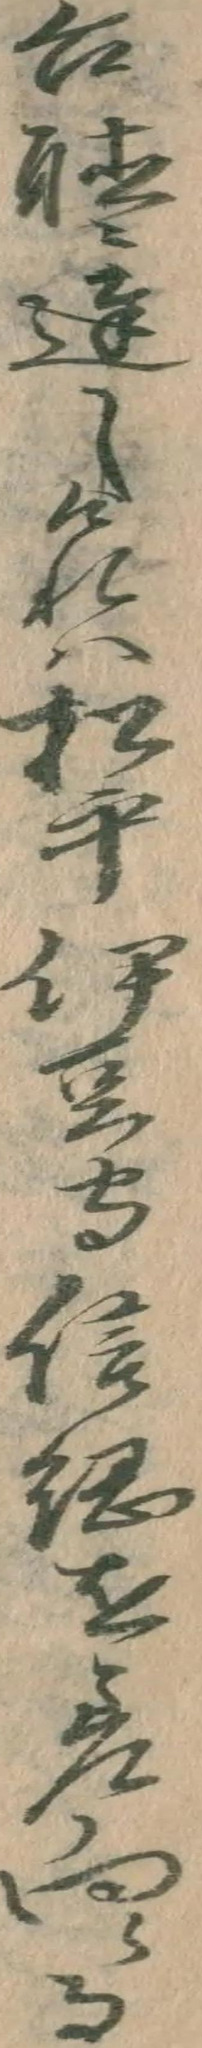召聴に達しけれは松平伊豆守信濃を差向らる
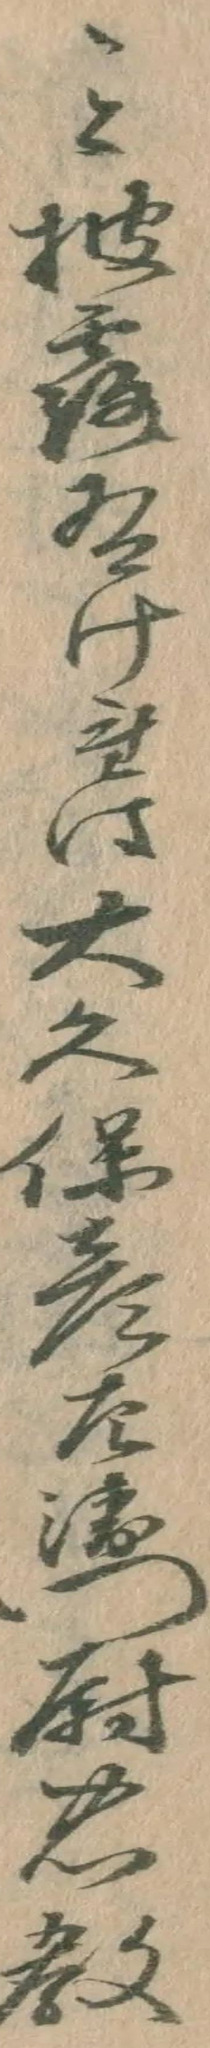ゝと披露有け連は大久保彦左衛門尉忠教
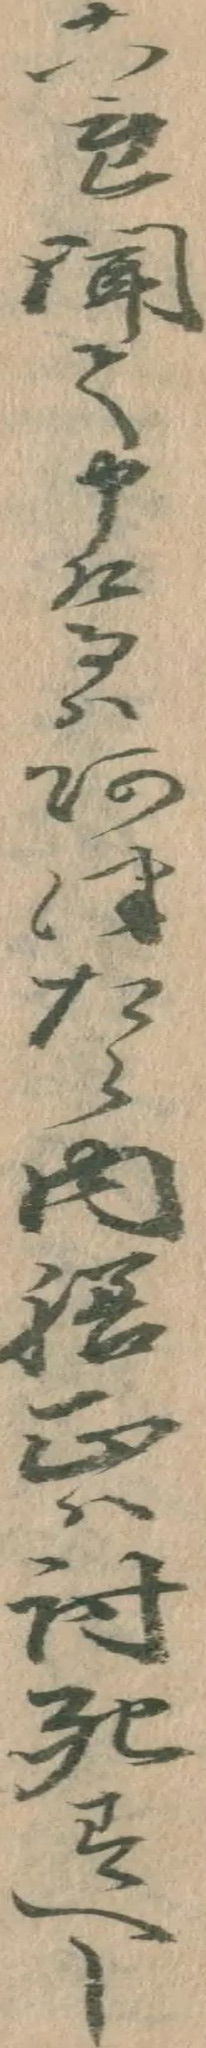古連聞て申けるは阿津たら内膳正は討死春へし
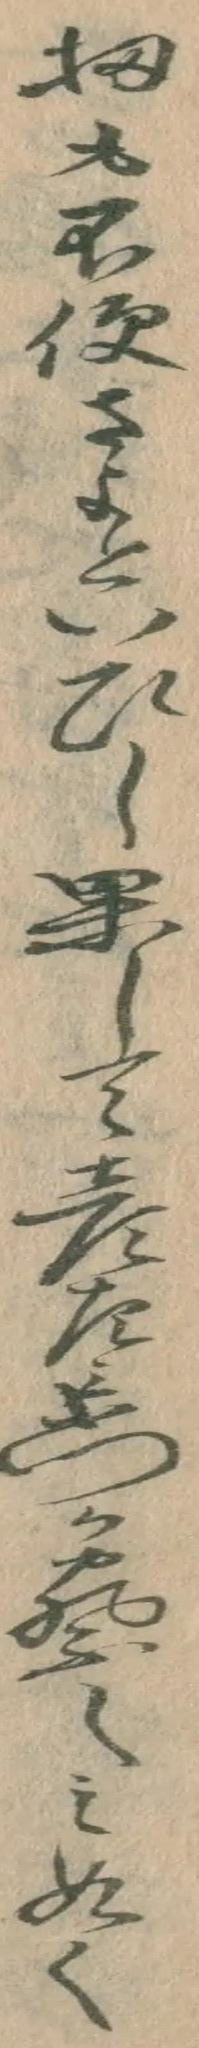扨も不便さよといひし果して彦左衛門か察し之如く
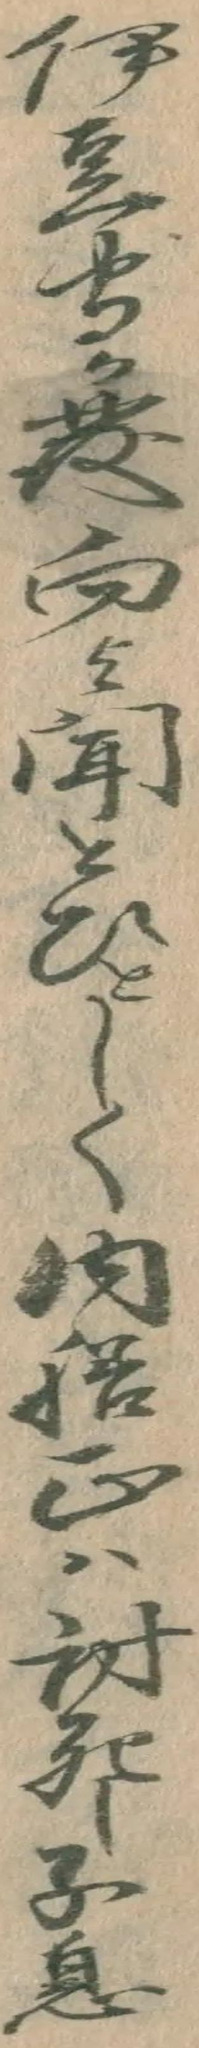伊豆守か発向与聞とひとしく内膳正は討死し子息
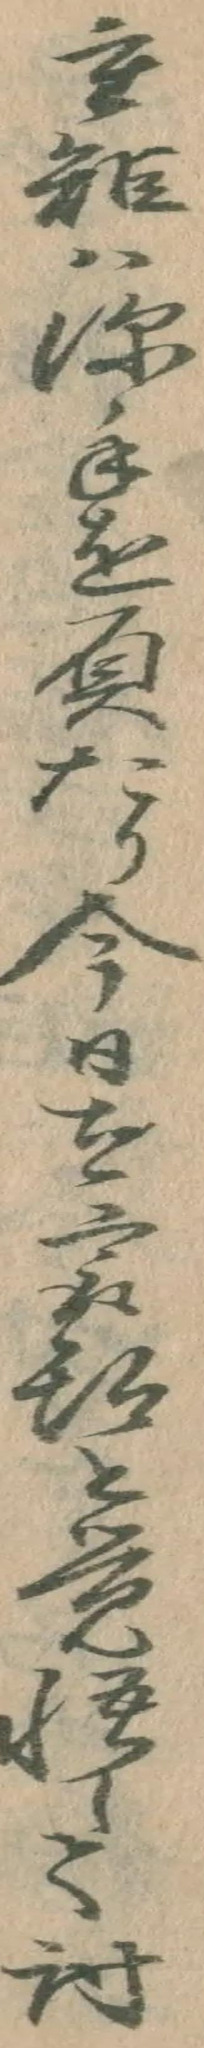重矩は深手を負たり今日を最期と覚悟して討
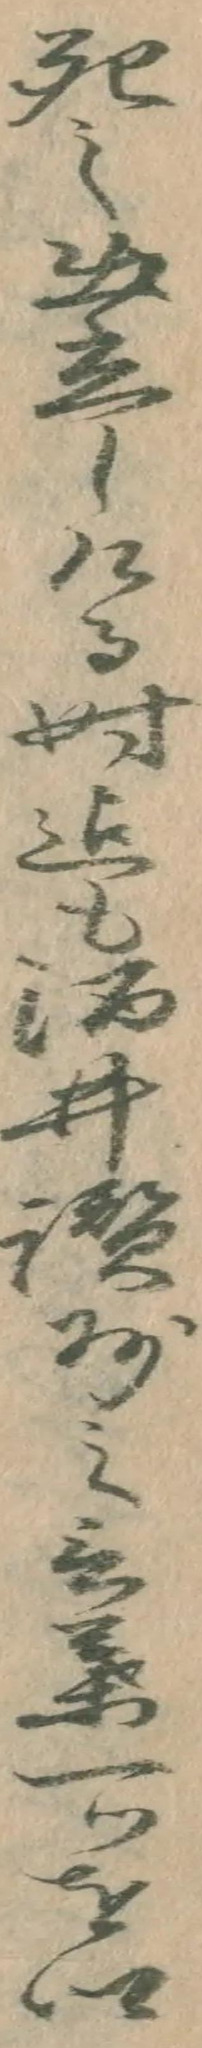死し出立しける時迄も酒井讃州之言葉一つを以
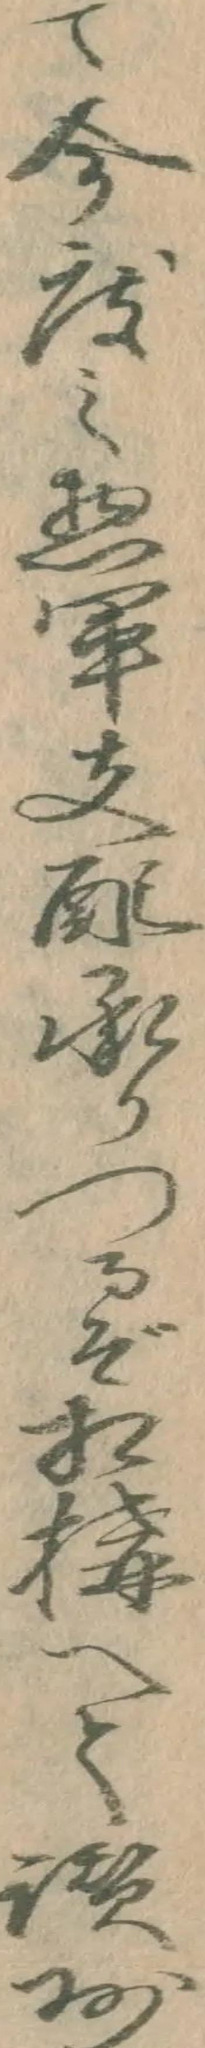て今度之惣軍支配承りつるぞあい相構へて讃州

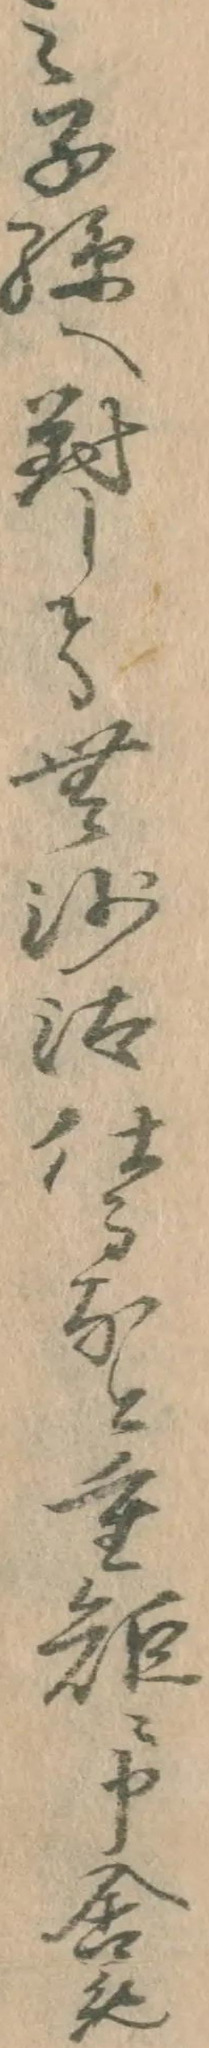之子孫へ対して無沙汰仕るなと重矩に申舎免
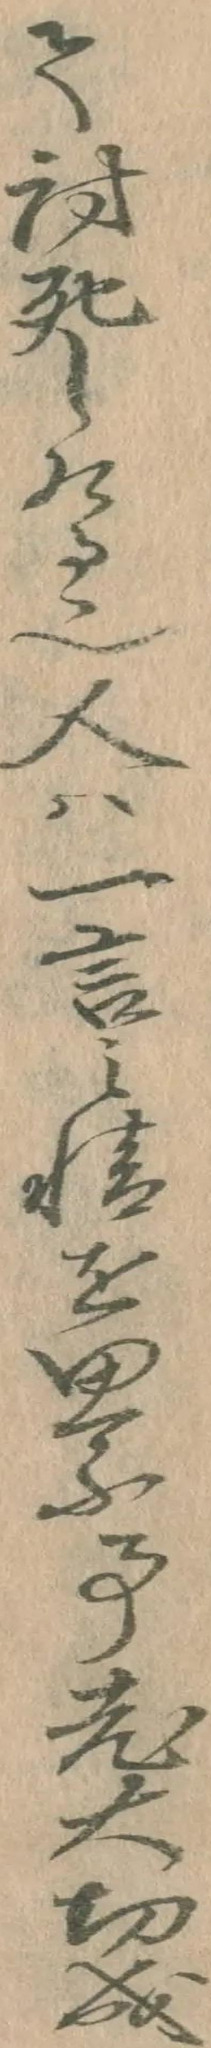て討死しける也人は一言之情を思ふ事老大切成
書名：切支丹御退治記 49巻. [2]
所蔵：国立国会図書館 National Diet Library, JAPAN
